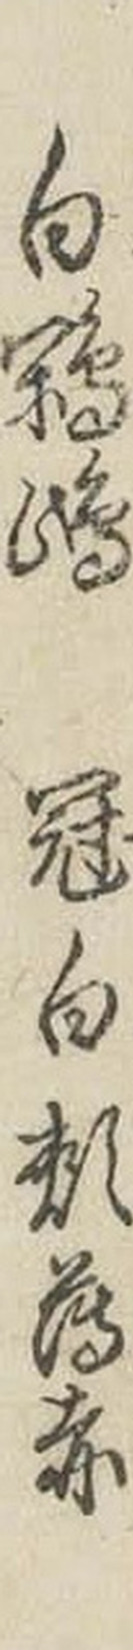白鷴䳄冠白頬薄赤
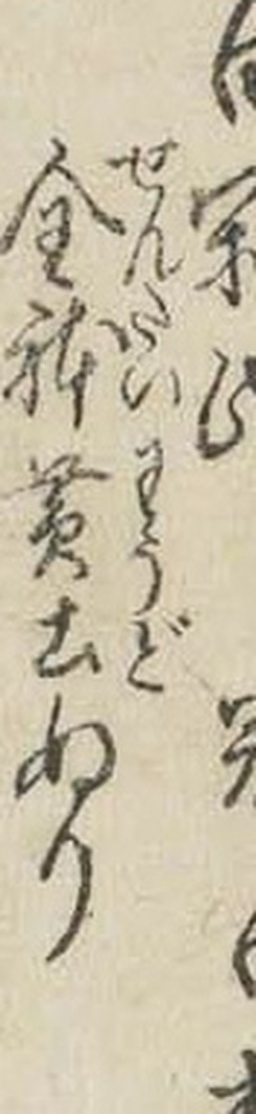全体黄土ぬり
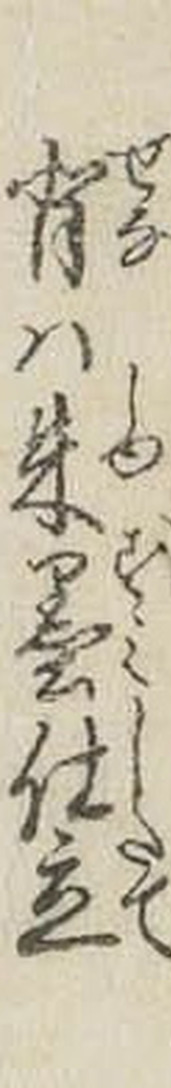背は朱墨仕立
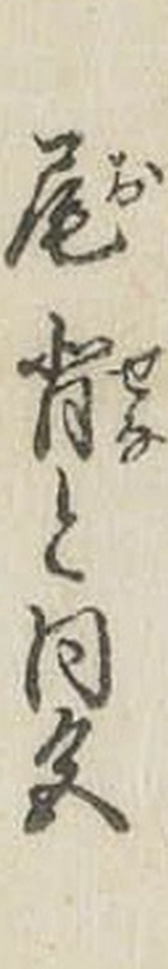尾背と同色
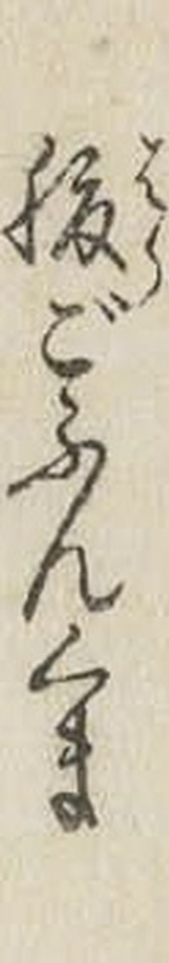腹ごふんくま

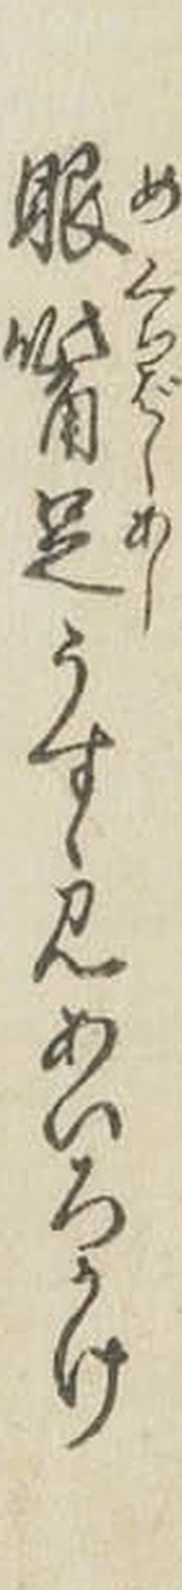眼嘴足うすゝみあいろかけ
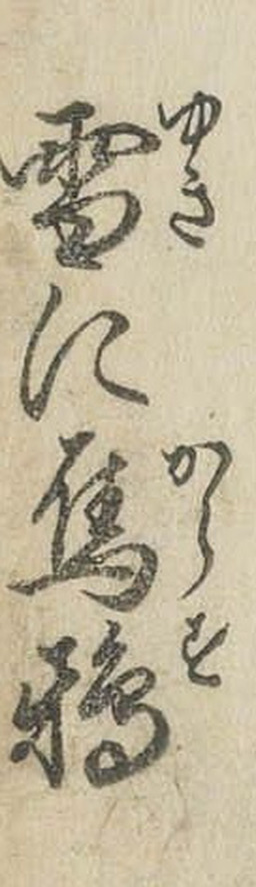雪に烏鴉

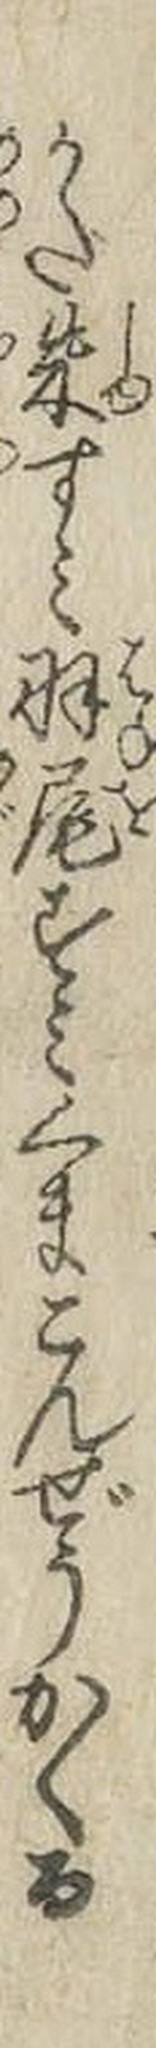かた朱すみ羽尾すみくまこんぜうかくる
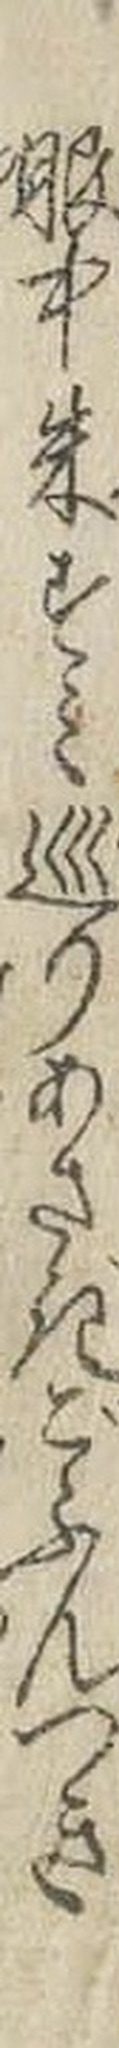眼中朱すみ巡りあさぎごふんつき
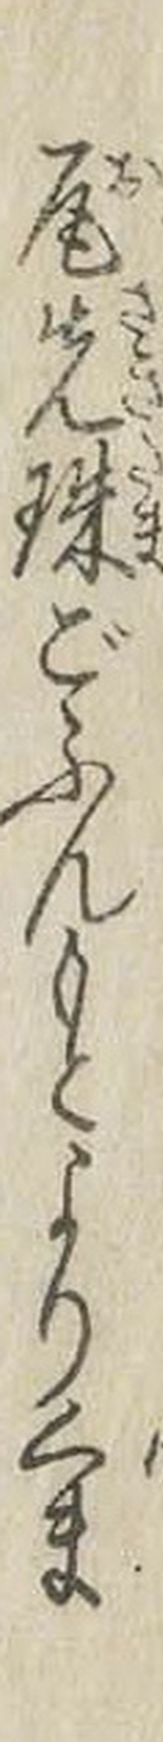尾先珠ごふんもとよりくま
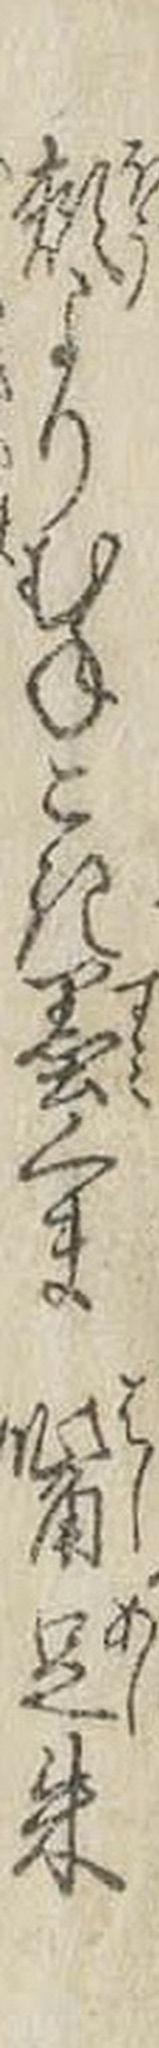頬よりむねこき墨くま嘴足朱
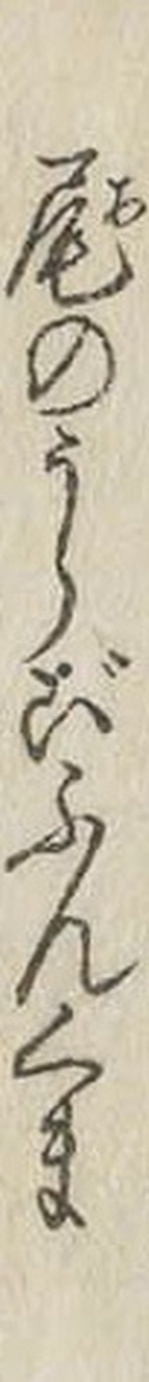尾のうらごふんくま
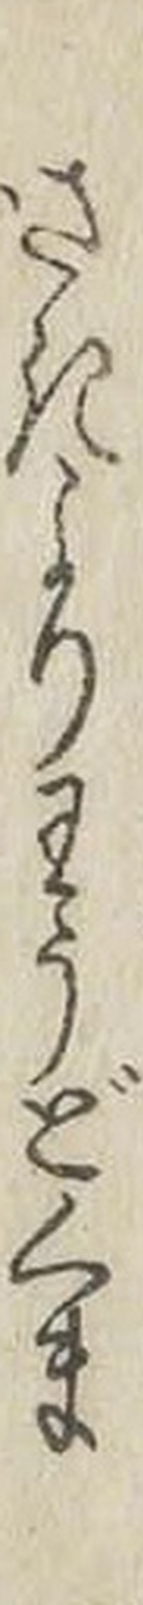さきよりわうどくま
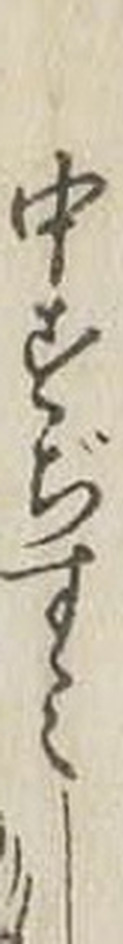中すぢすみ
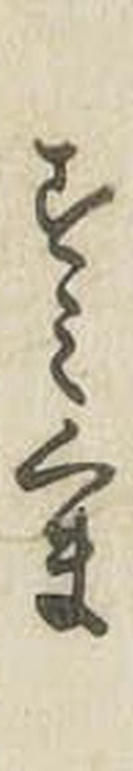すみくま
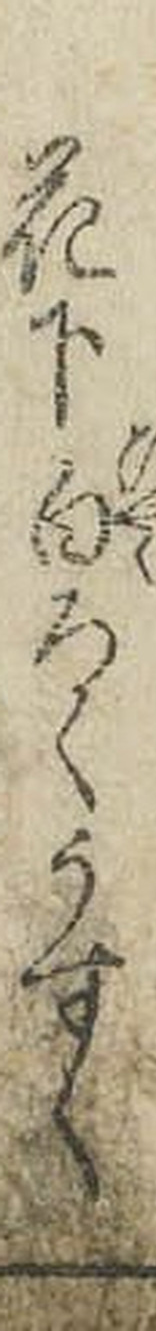花下白ろくうすく
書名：絵本写宝袋 9巻 8之巻
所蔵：東京学芸大学教育コンテンツアーカイブ
